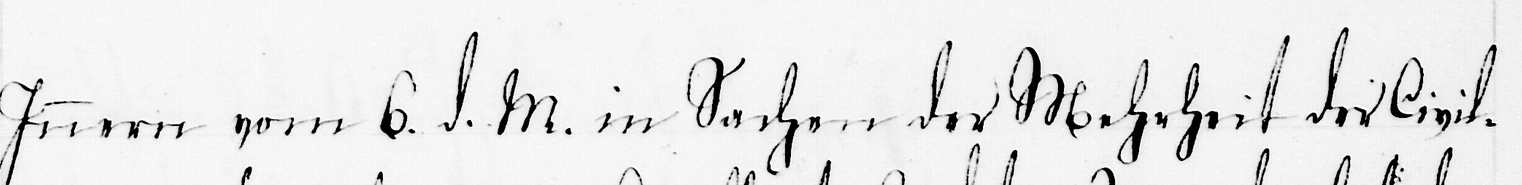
Innern vom 6. d. M. in Sachen der Mehrheit der Civil¬
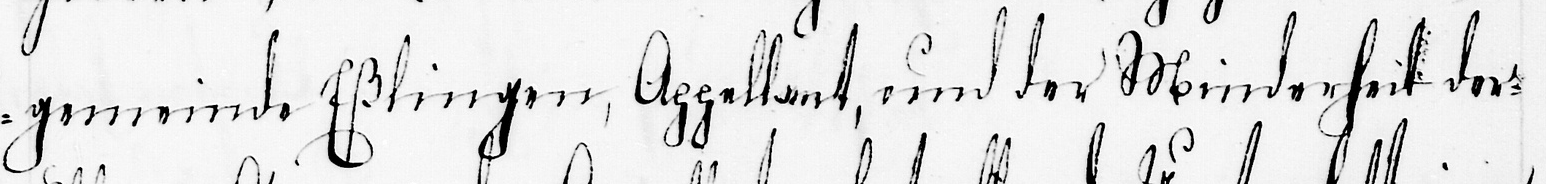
gemeinde Eßlingen, Appellant, und der Minderheit ders¬
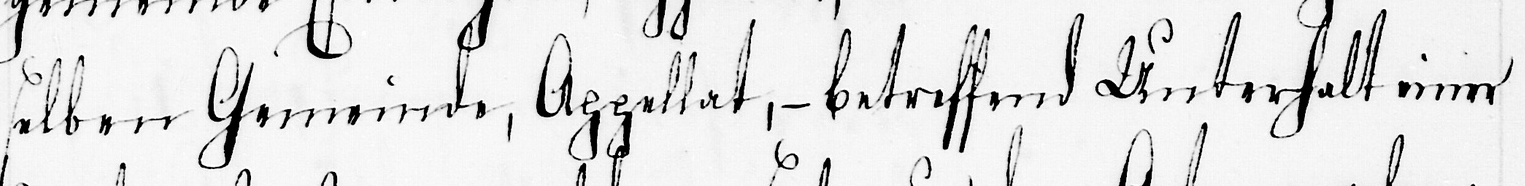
elben Gemeinde, Appellat, – betreffend Unterhalt einer
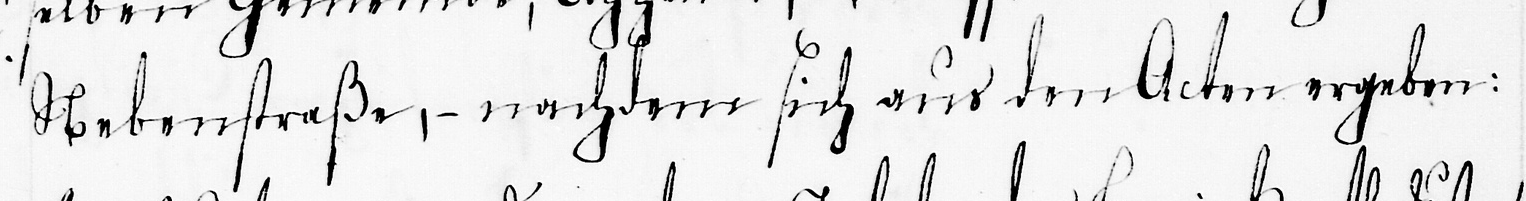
Nebenstraße, – nachdem sich aus den Acten ergeben:
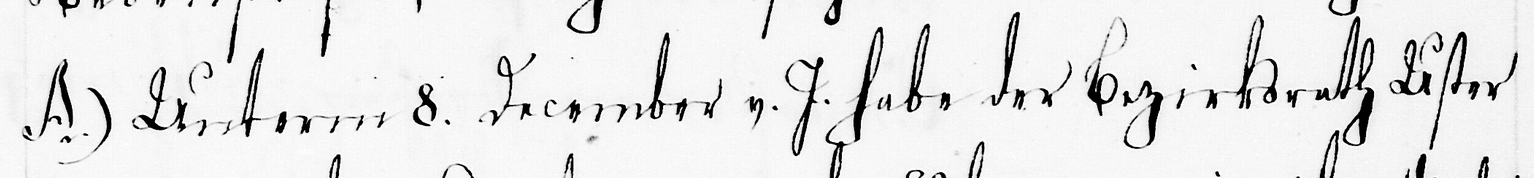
A.) Unterm 8. December v. J. habe der Bezirksrath Uster
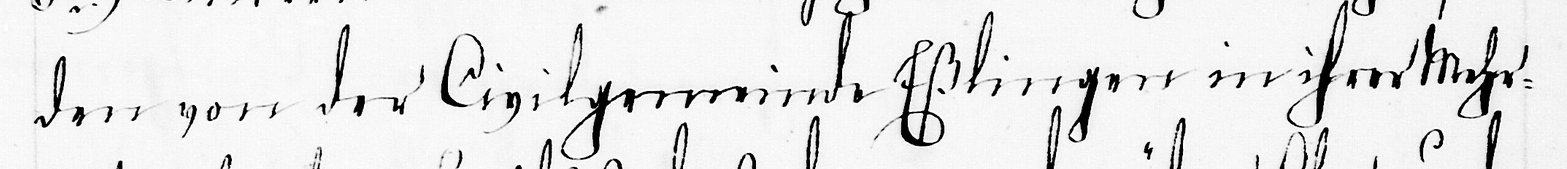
den von der Civilgemeinde Eßlingen in ihrer Mehr¬
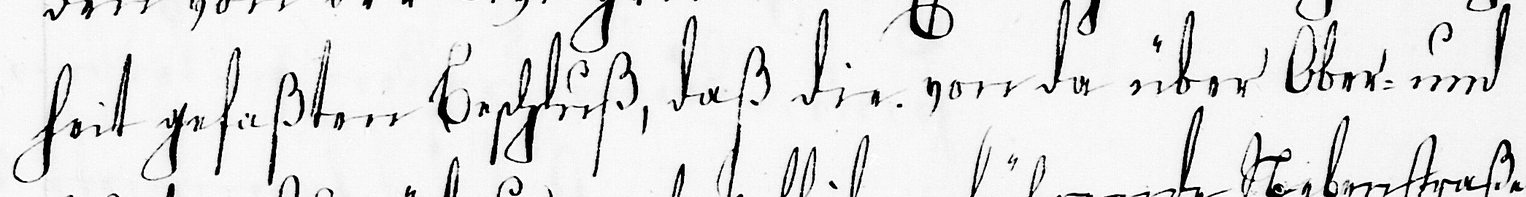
heit gefaßten Beschluß, daß die von da über Ober- und
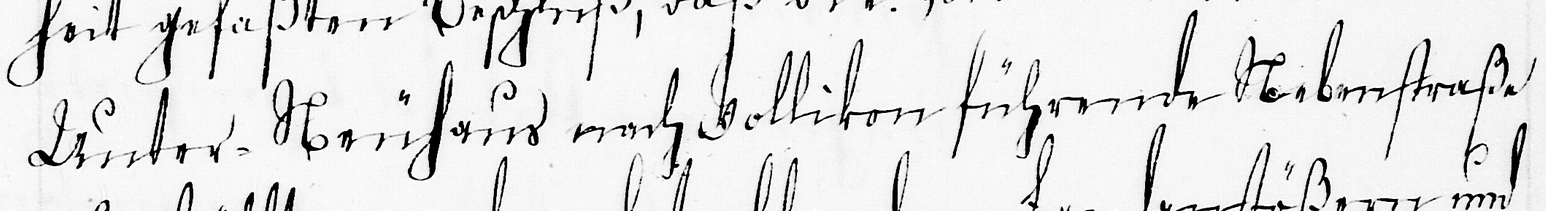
Unter-Neuhaus nach Vollikon führende Nebenstraße
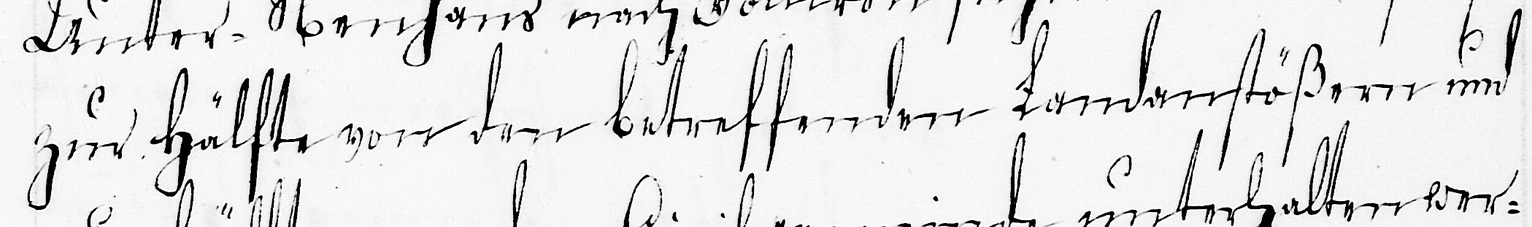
zur Hälfte von den betreffenden Landanstößern und
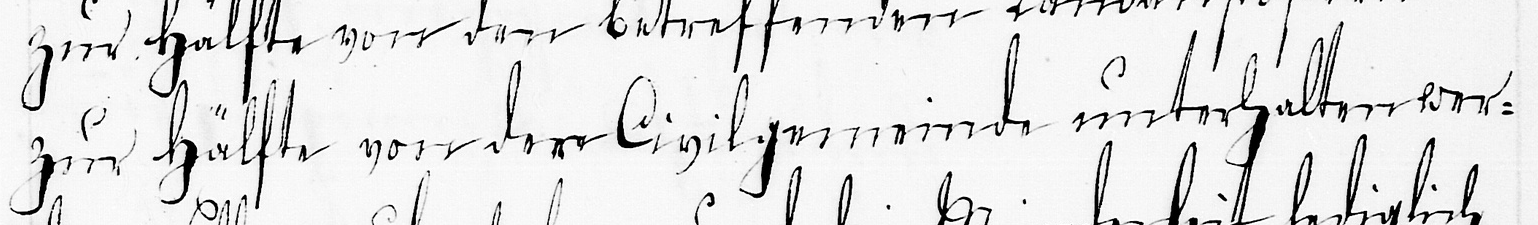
zur Hälfte von der Civilgemeinde unterhalten wer¬
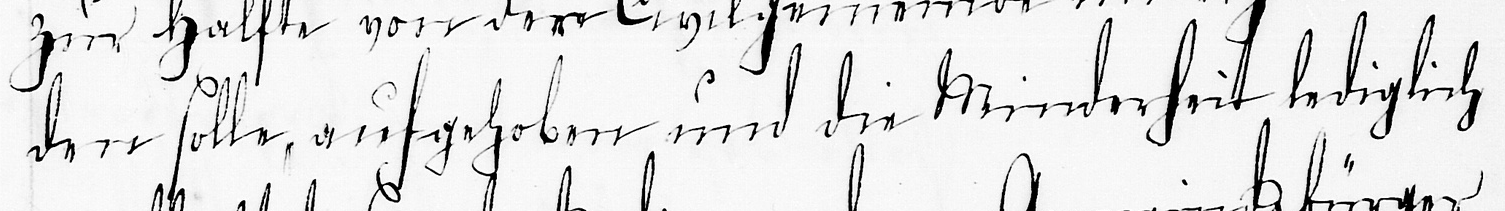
den solle, aufgehoben und die Minderheit lediglich
